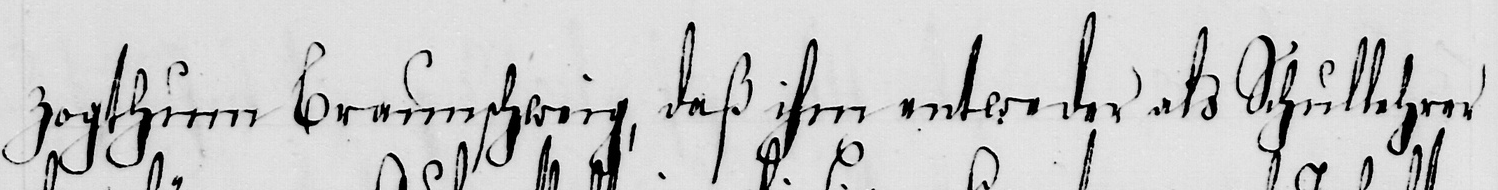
zogthum Braunschweig, daß ihm entweder als Schullehrer
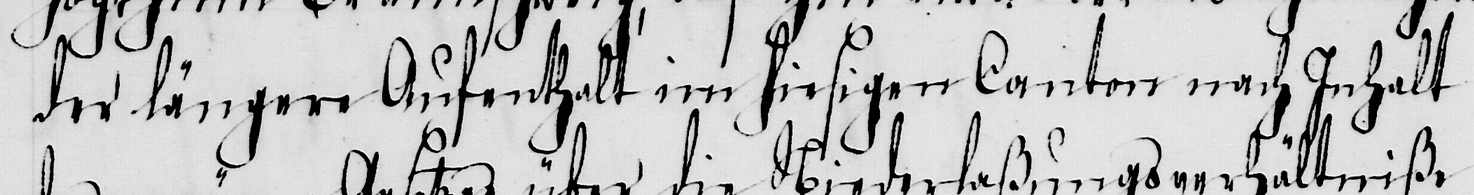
der längere Aufenthalt im hiesigen Canton nach Inhalt
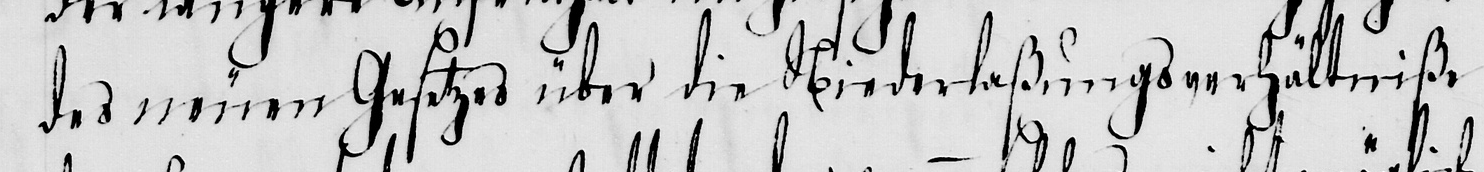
des neuen Gesetzes über die Niederlaßungsverhältniße
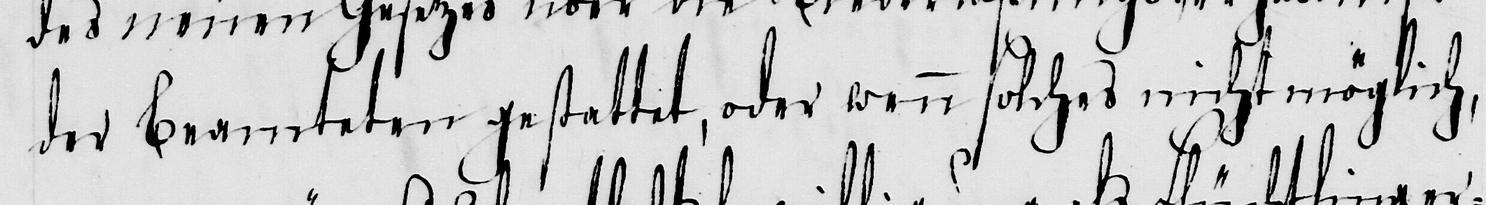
der Beamteten gestattet, oder wenn solches nicht möglich,
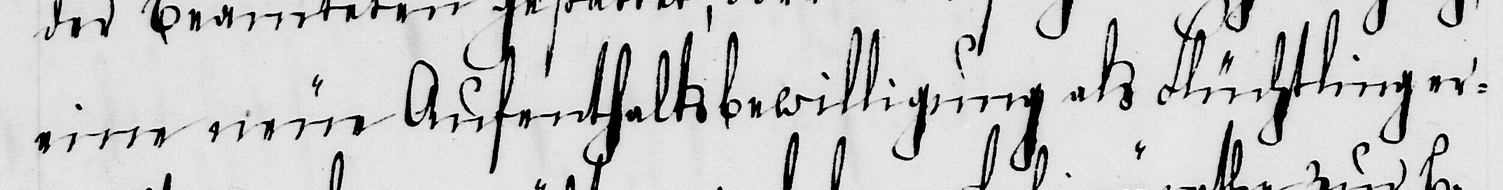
eine neue Aufenthaltsbewilligung als Flüchtling er¬
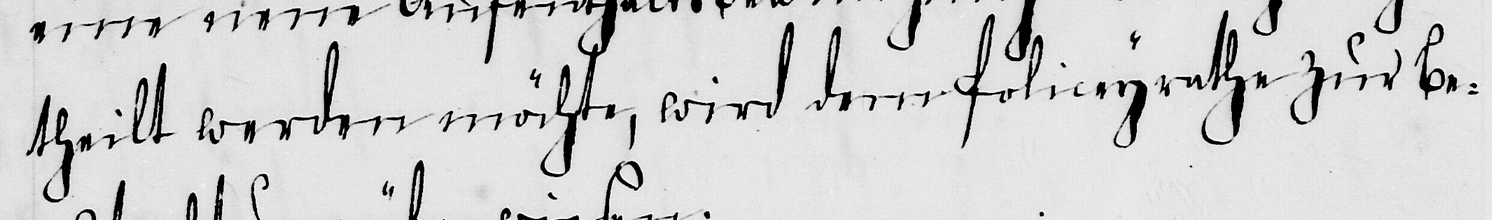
theilt werden möchte, wird dem Policeyrathe zur Be¬
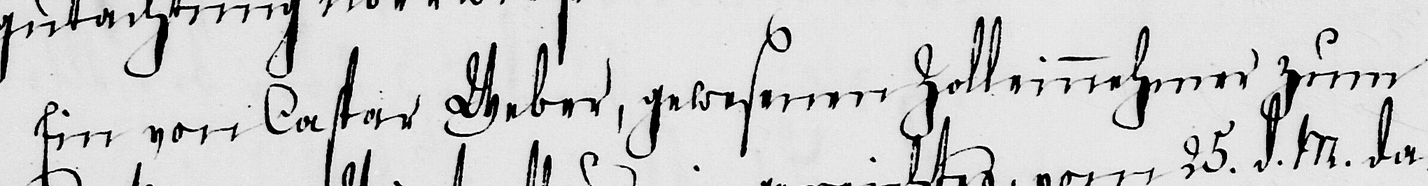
Ein von Caspar Weber, gewesenen Zolleinnehmer zum
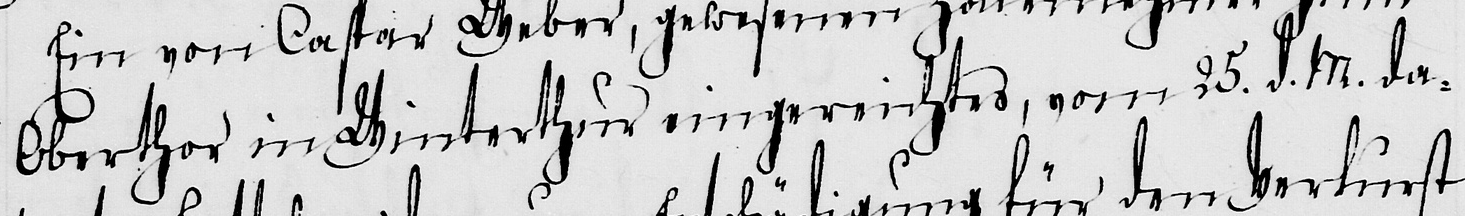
Oberthor in Winterthur eingereichtes, vom 25. d. M. da¬
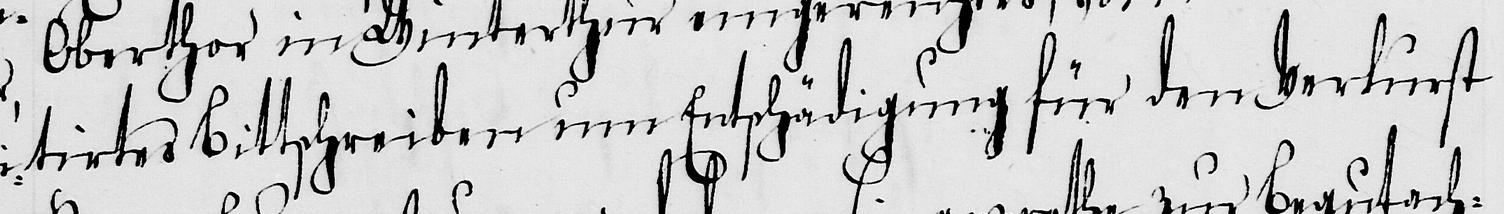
tirtes Bittschreiben um Entschädigung für den Verlust
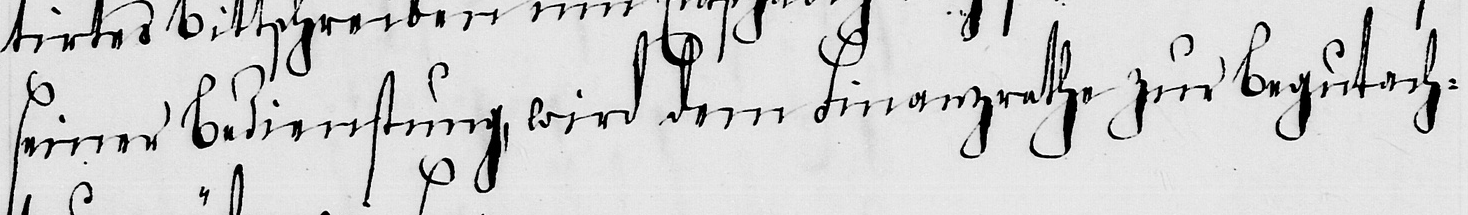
seiner Bedienstung, wird dem Finanzrathe zur Begutach¬
